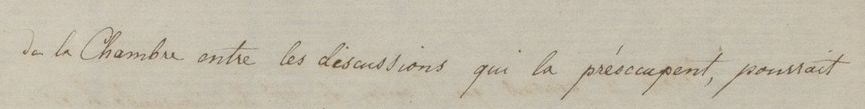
de la Chambre entre les discussions qui la préoccupent, pourrait
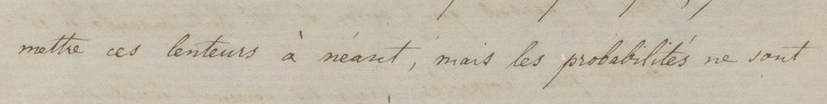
mettre ces lenteurs à néant, mais les probabilités ne sont
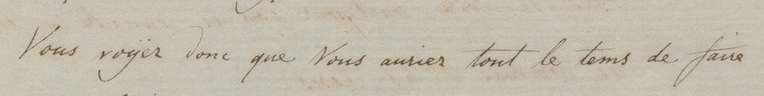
Vous voyez donc que Vous auriez tout le tems de faire
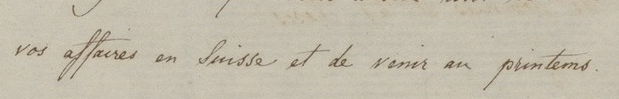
vos affaires en Suisse et de venir au printems.
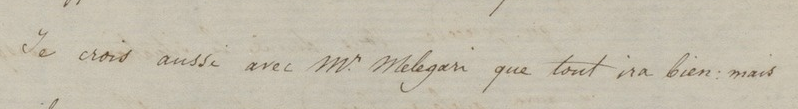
Je crois aussi avecMrMelegari que tout ira bien: mais
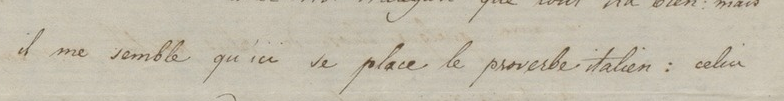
il me semble qu'ici se place le proverbe italien: celui
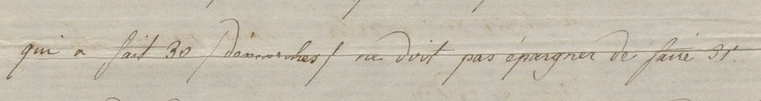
qui a fait 30 (démarches) ne doit pas épargner de faire 31.
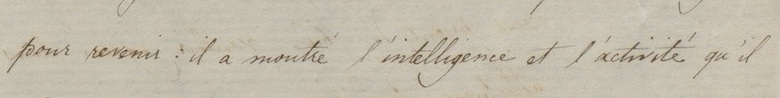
pour revenir: il a montré l'intelligence et l'activité qu'il
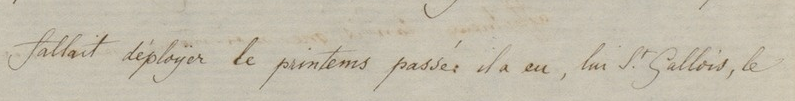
fallait déployer le printems passé: il a eu, lui St Gallois, le
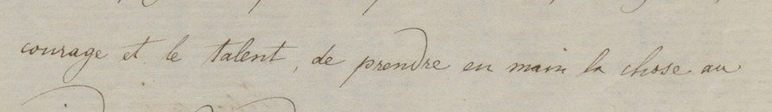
courage et le talent, de prende en main la chose au
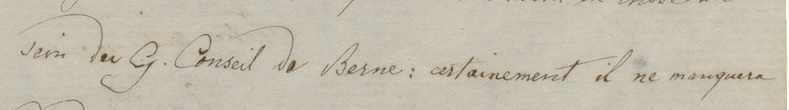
sein du G. Conseil de Berne: certainement il ne manquera
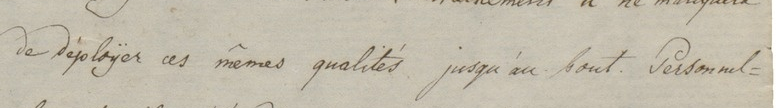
de déployer ces mêmes qualités jusqu'au bout. Personnel-
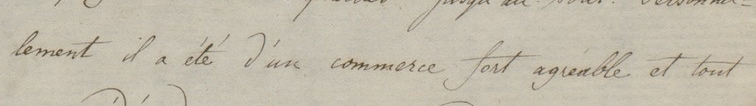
lement il a été d'un commerce fort agréable et tout
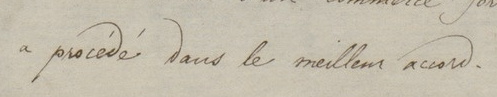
a procédé dans le meilleur accord
